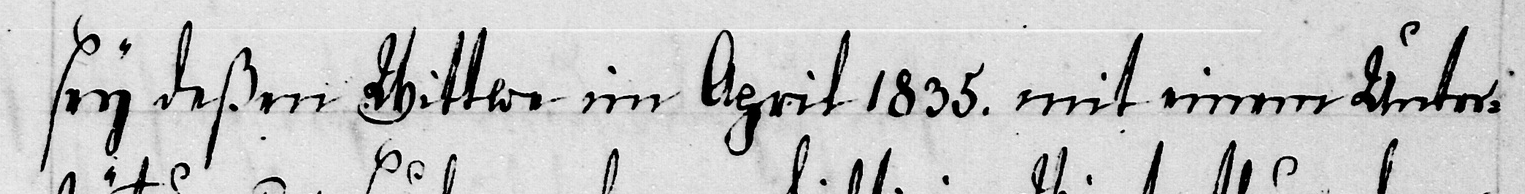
sey deßen Wittwe im April 1835. mit einem Unter¬
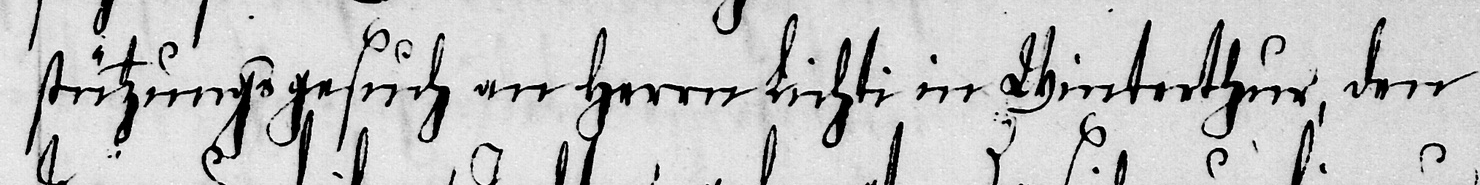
stützungsgesuch an Herrn Lichti in Winterthur, den
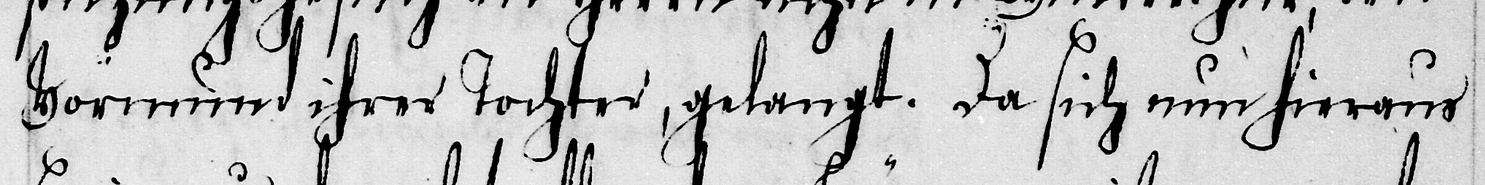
Vormund ihrer Tochter, gelangt. Da sich nun hieraus
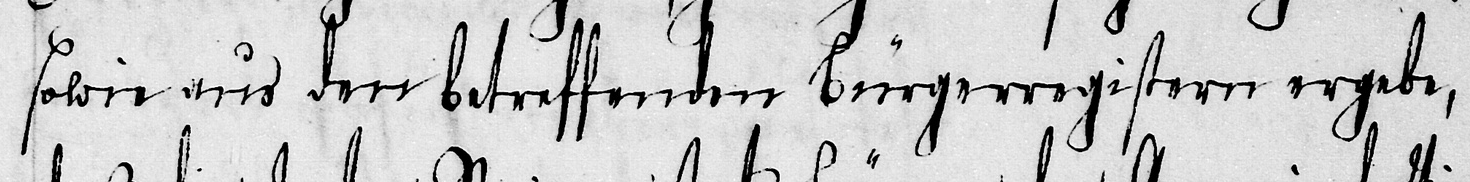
sowie aus den betreffenden Bürgerregistern ergebe,
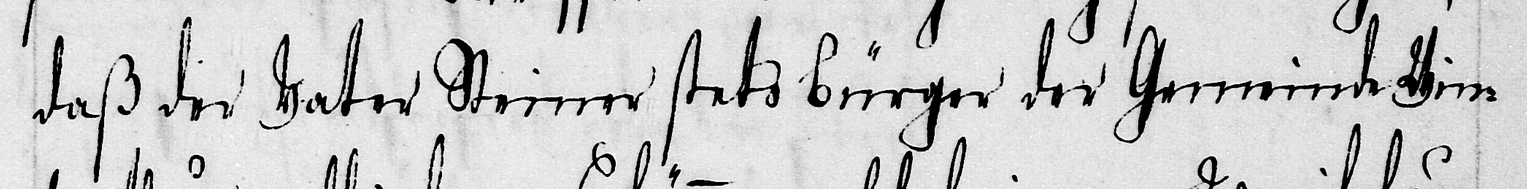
daß der Vater Steiner stets Bürger der Gemeinde Win¬
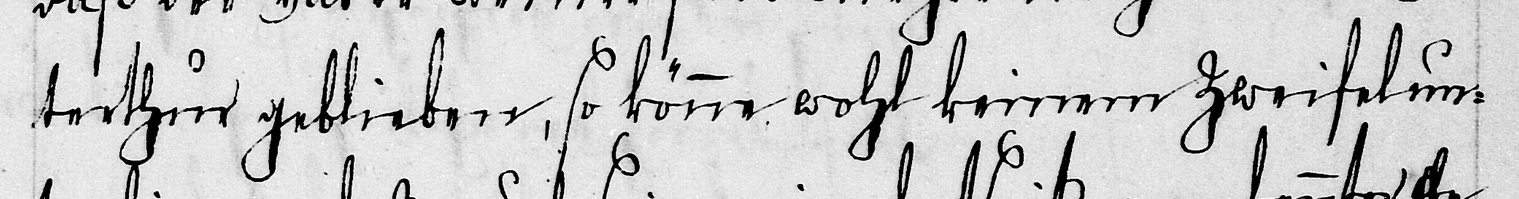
terthur geblieben, so könne wohl keinem Zweifel un¬
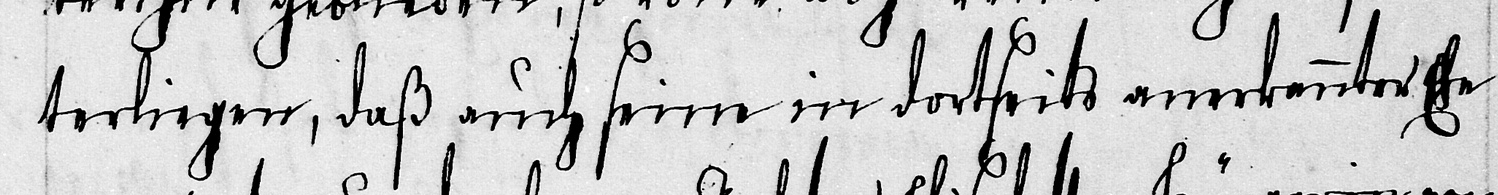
terliegen, daß auch seine in dortseits anerkannter Ehe
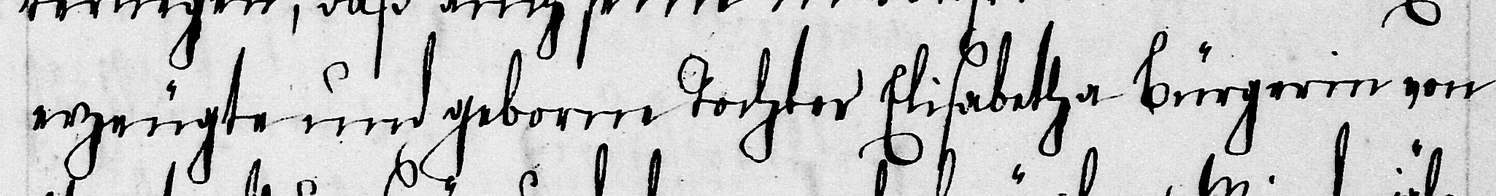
erzeugte und geborne Tochter Elisabetha Bürgerin von
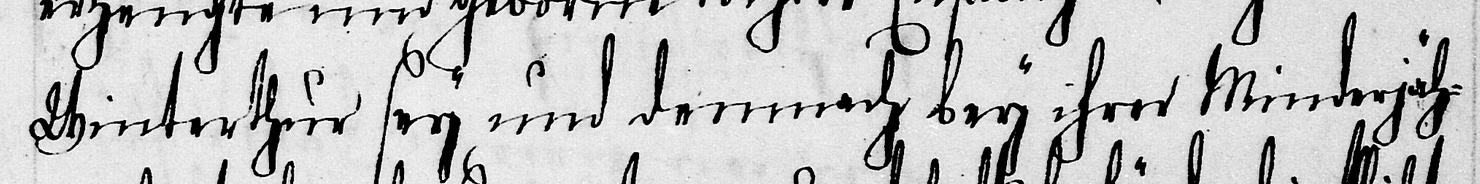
Winterthur sey und demnach bey ihrer Minderjäh¬
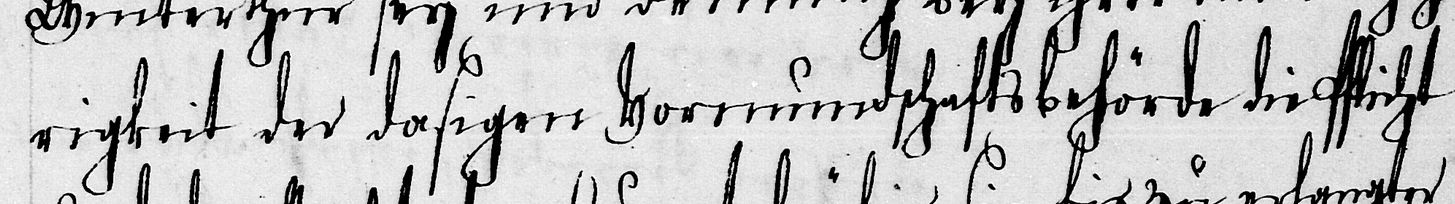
rigkeit der dasigen Vormundschaftsbehörde die Pflic¬
